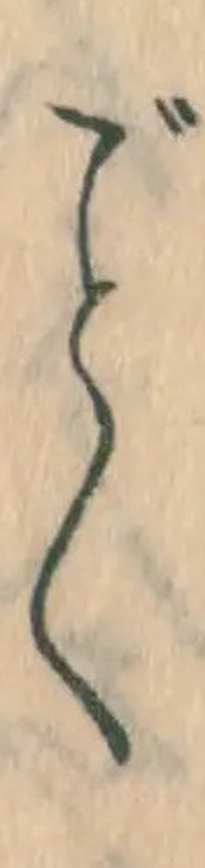ごとく

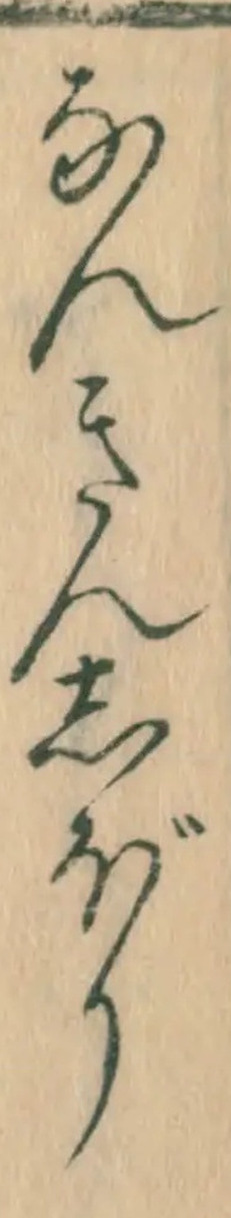なんきんしぼり
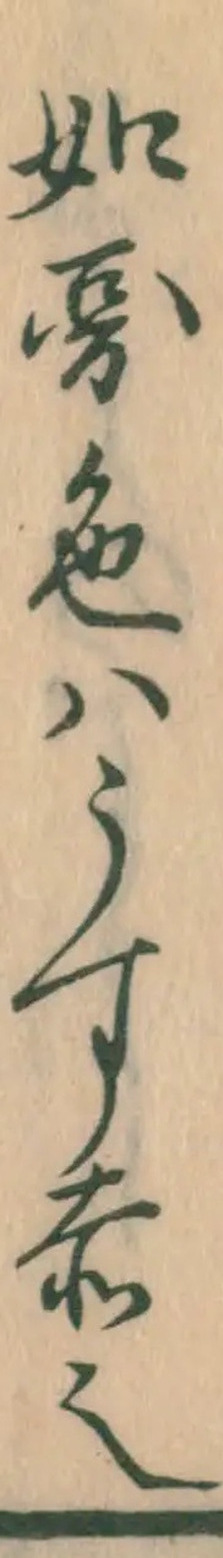如図色はうす赤也
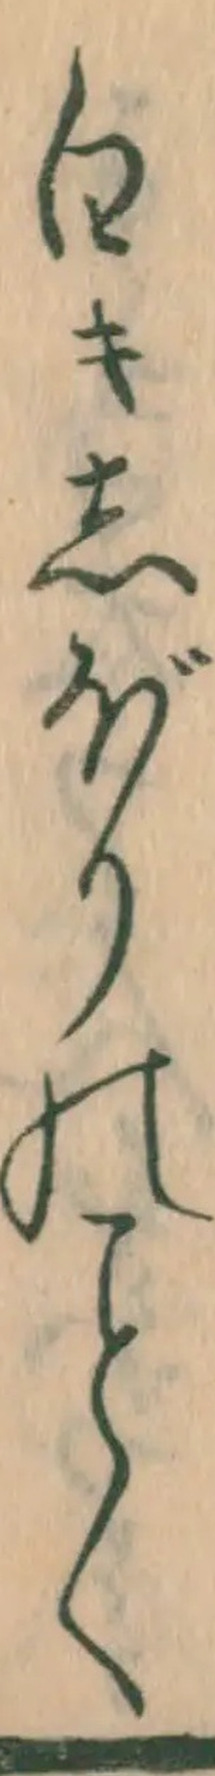白きしぼりのことく
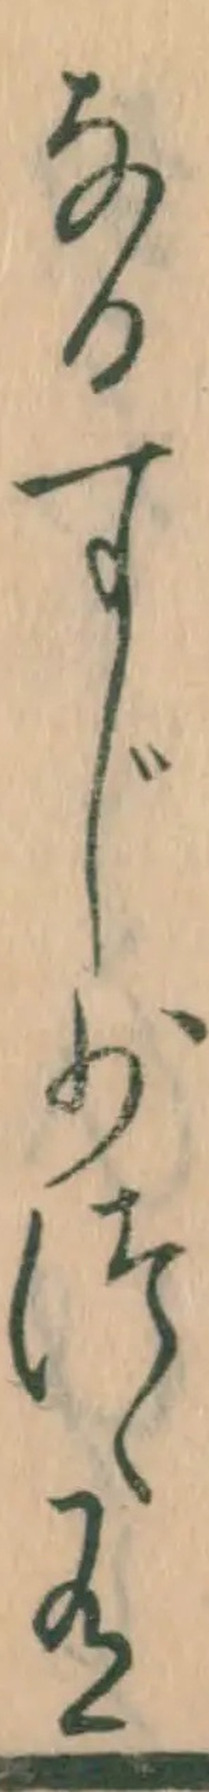なるすじ少つゝ有
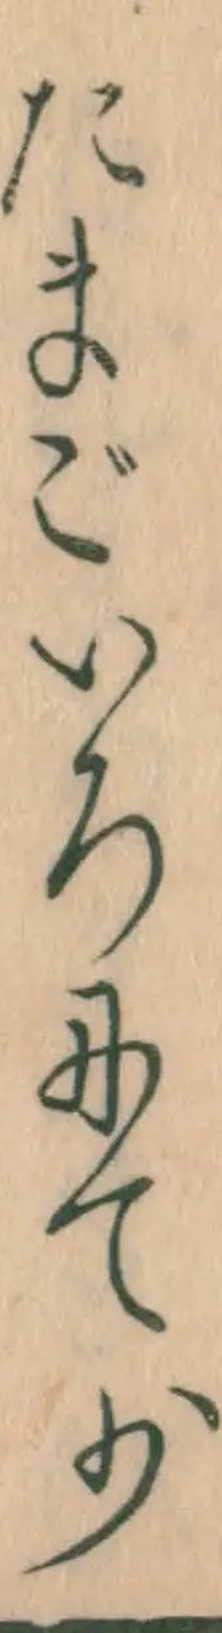たまごいろにて少
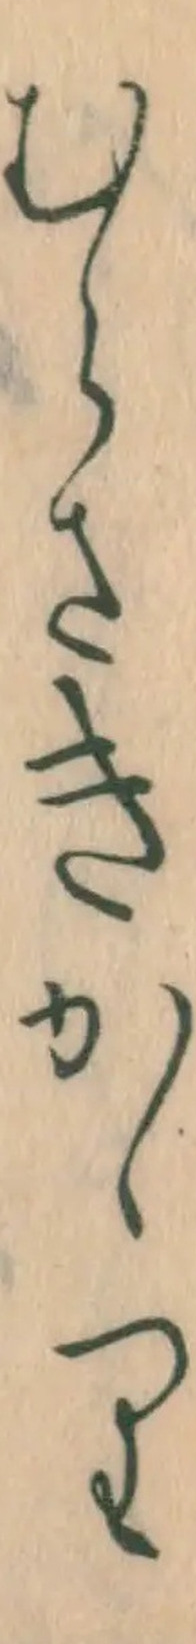むらさきかゝり
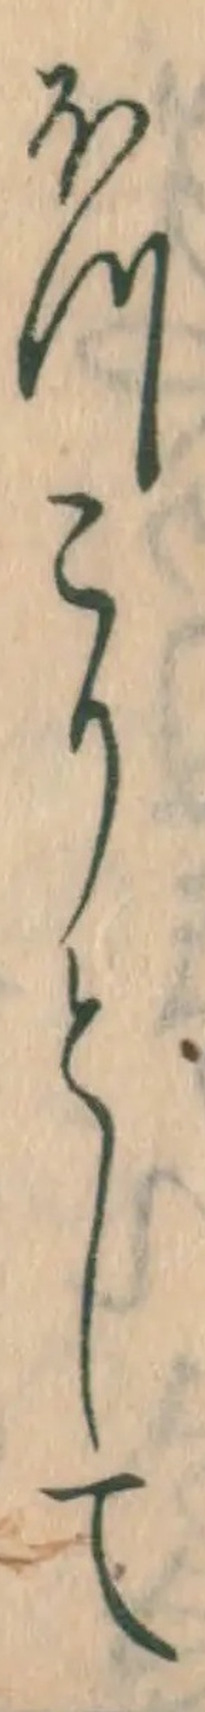ほつこりとして
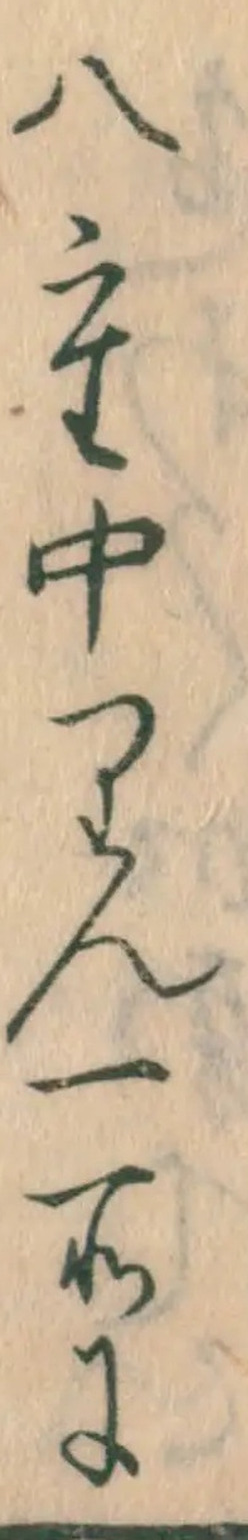八重中りん一所に
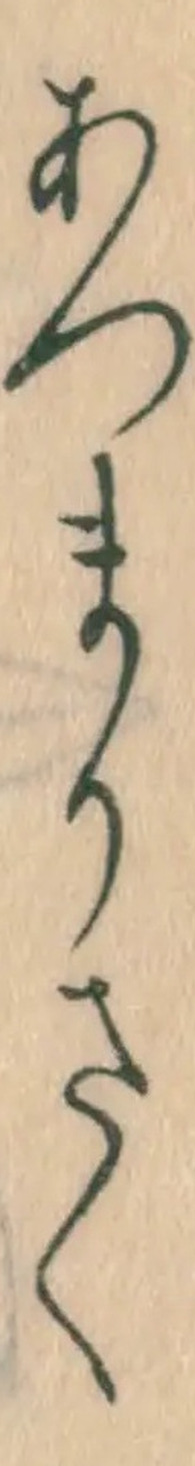あつまりさく
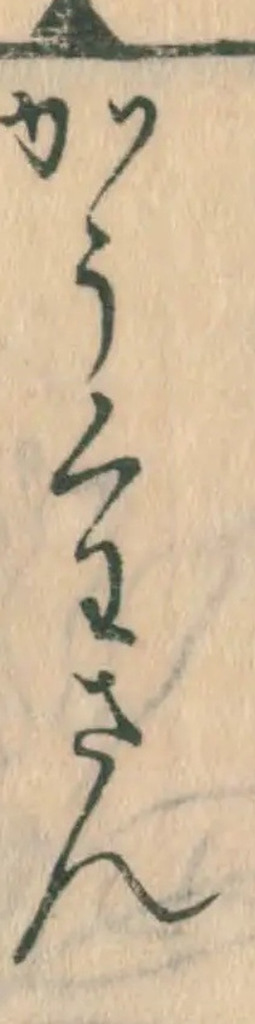▲かうくわさん
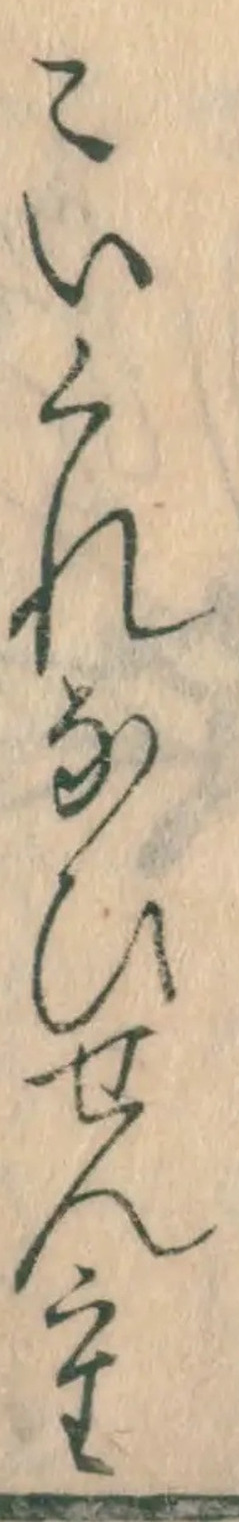こいくれなひせん重
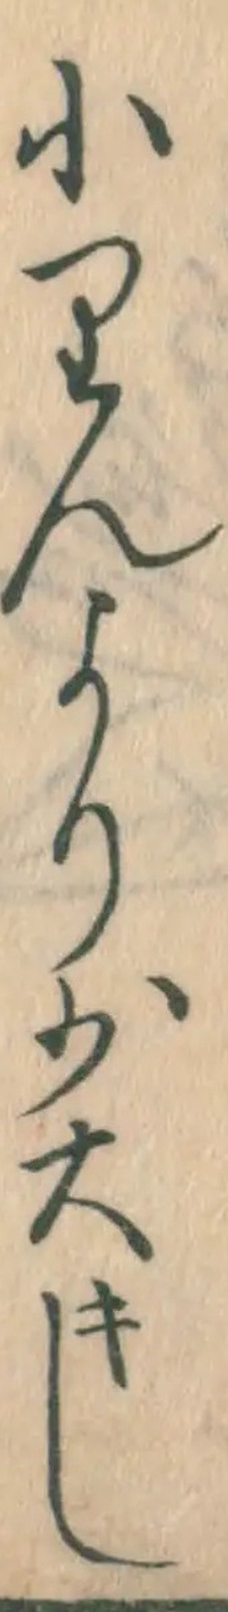小りんより少大きし

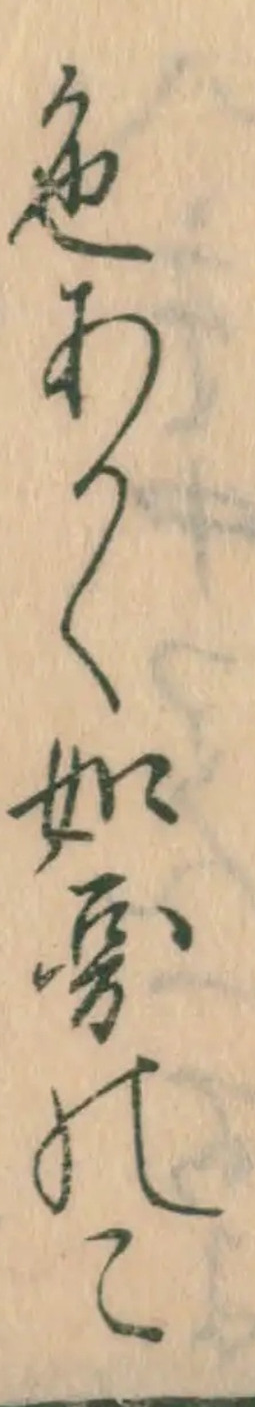色あかく如図のこ
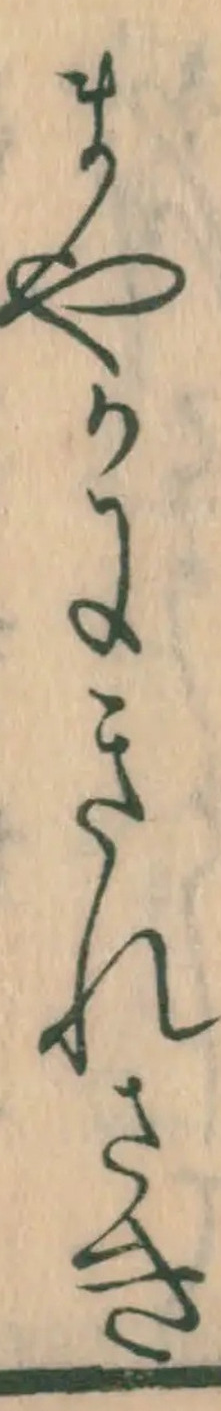まやかにきれさき
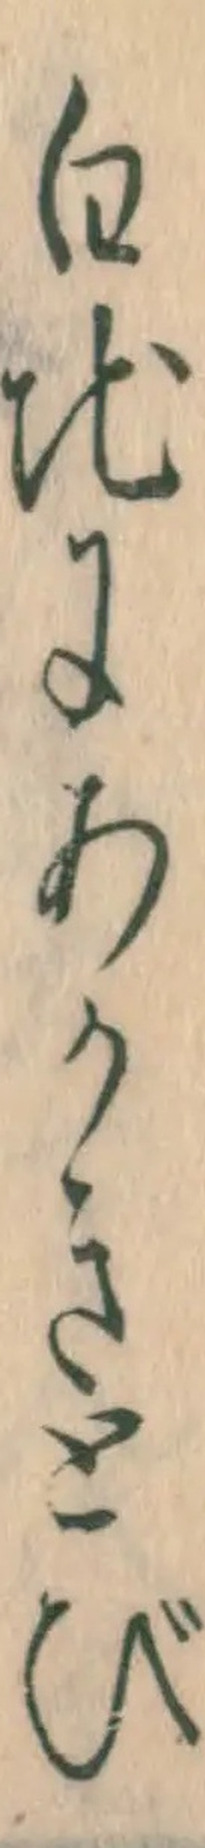白地にあかきとび
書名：錦繍枕 5巻. [3]
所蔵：国立国会図書館 National Diet Library, JAPAN
